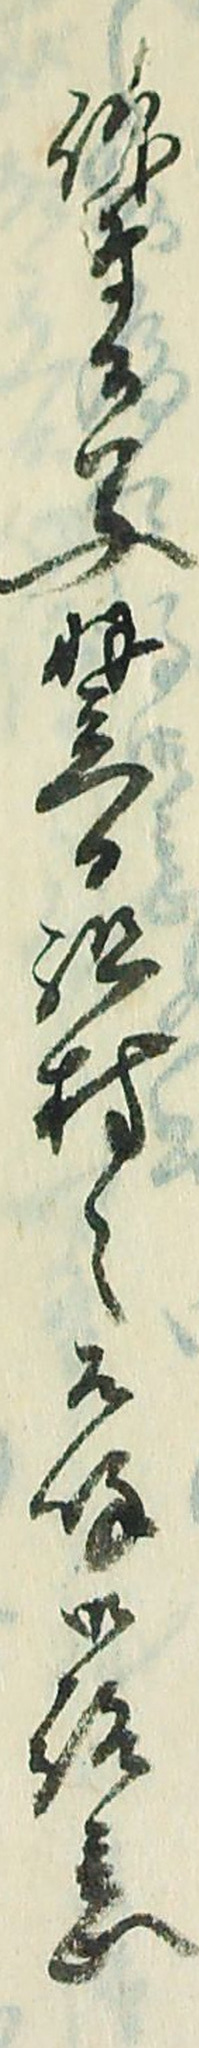仰付候写翌三日組村々召呼御趣意
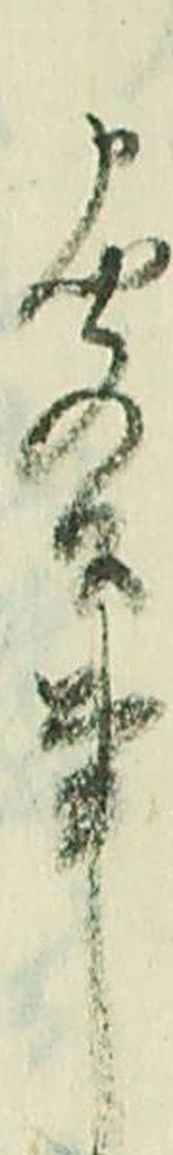申聞候事
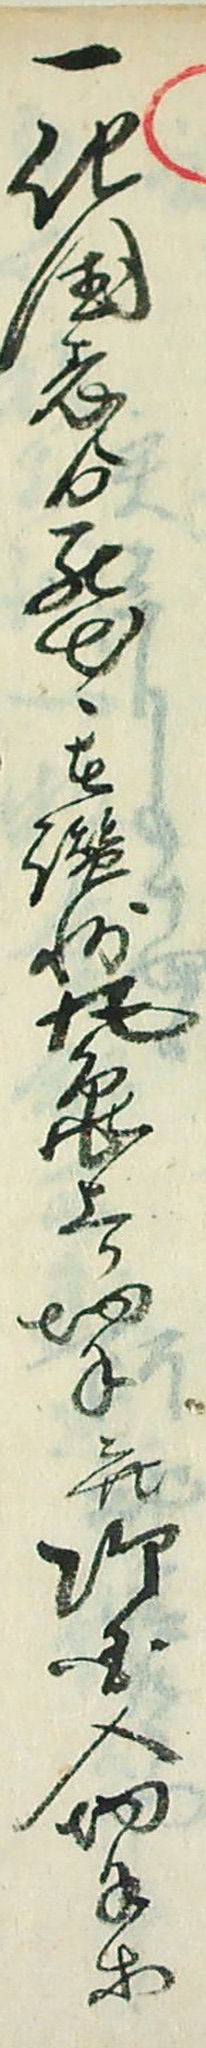一他国表ゟ罷出候者讃州丸亀上り切手幷御国入切手等
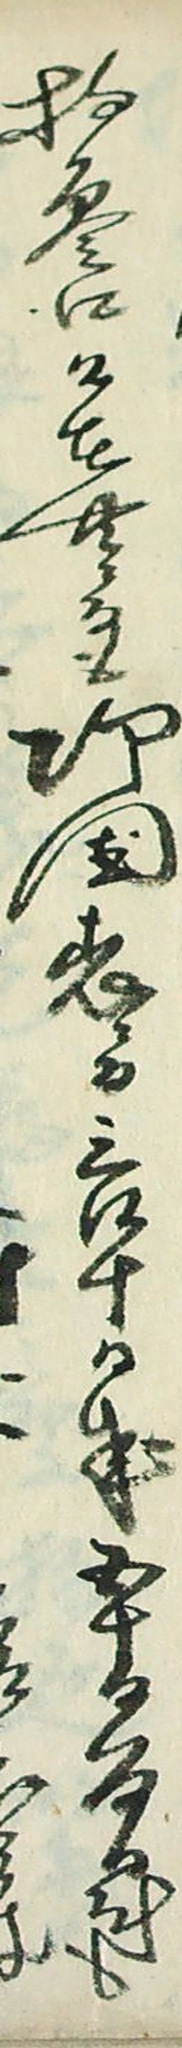持参仕候者共ニ而も御国表ニ而三四十日成五十日百日斗も
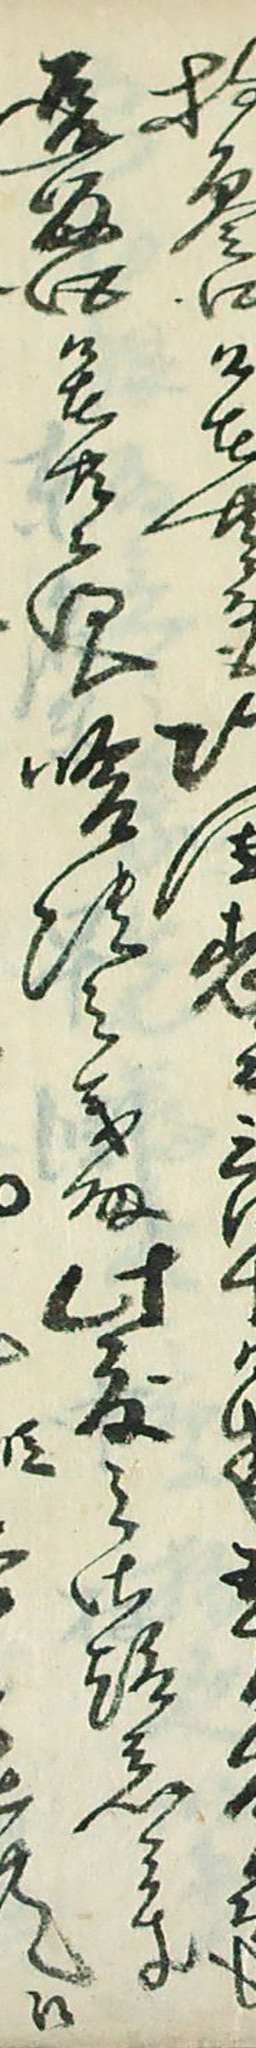逗留仕候者共候得ハ喰潰之義故此度之御趣意之丈

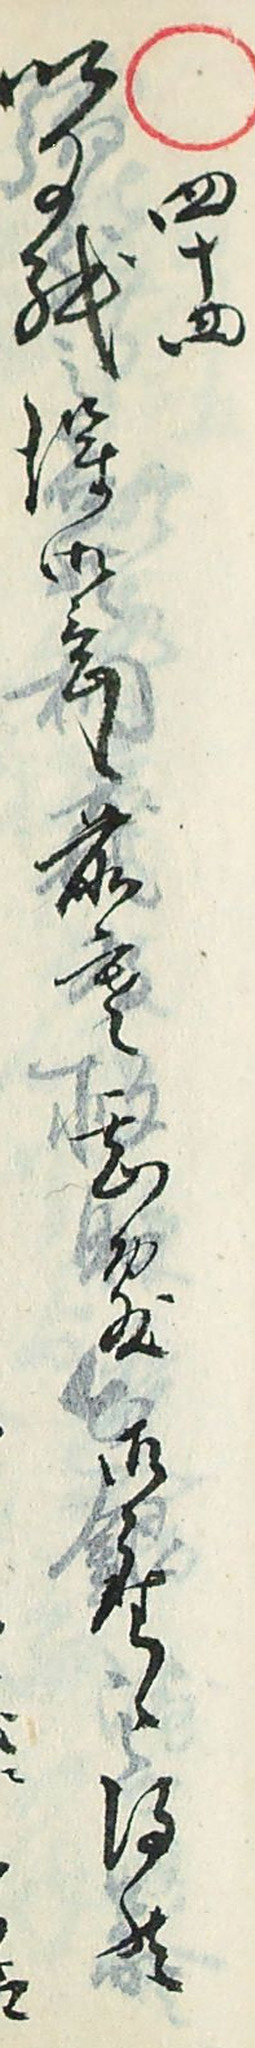以手紙得御意候前寒甚敷御座候得共
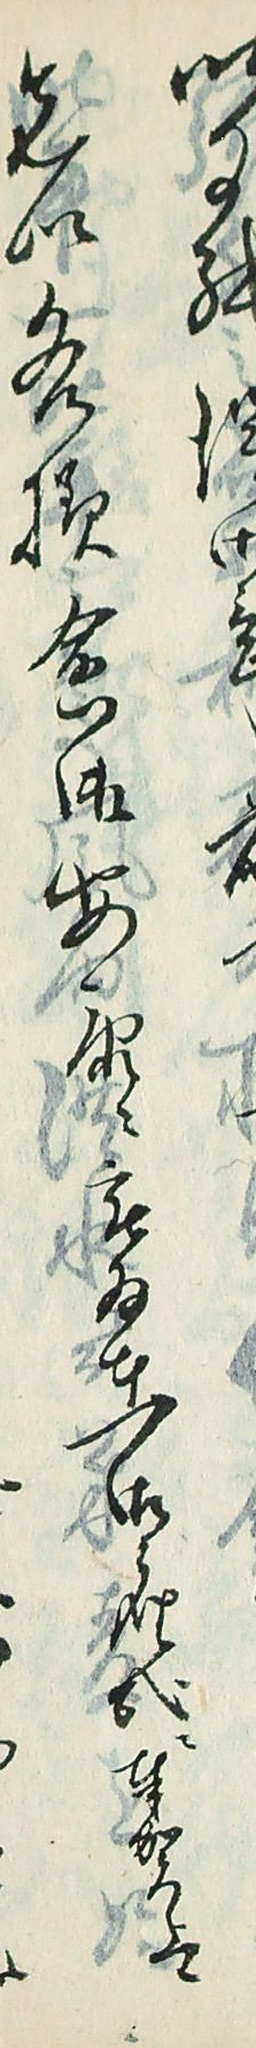先以各様愈後安康ニ被為在御座候哉ニ奉賀上候
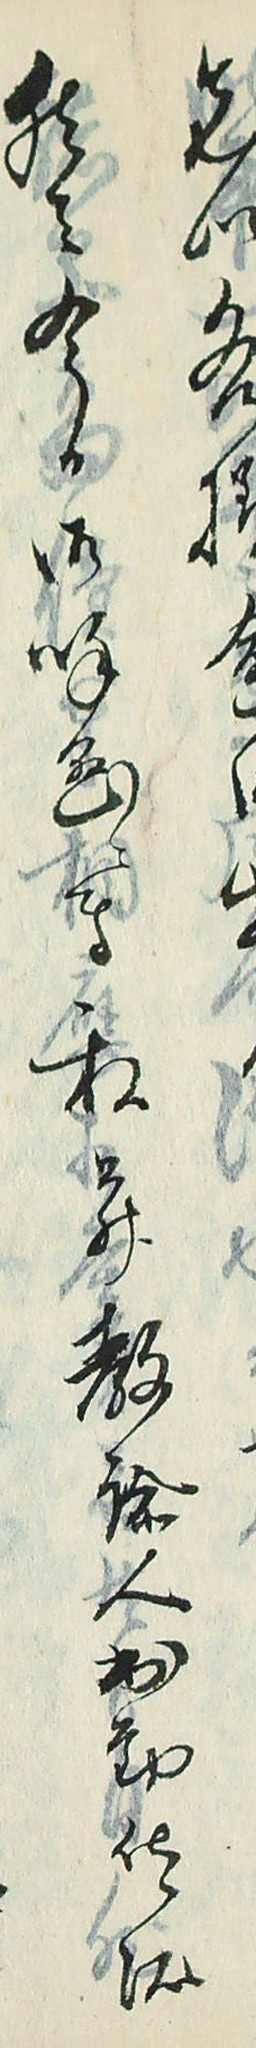然者今日御呼懸ニ付私幷教諭人出勤仕候所
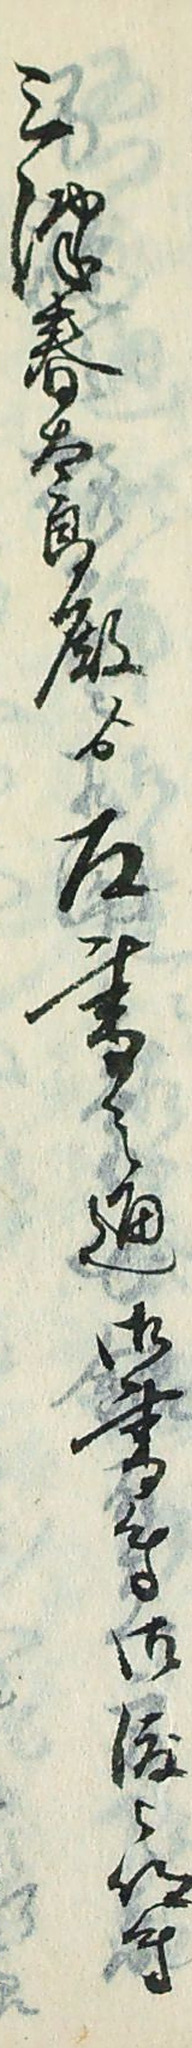三澤春太郎殿ゟ左書之通御書付御渡被仰付
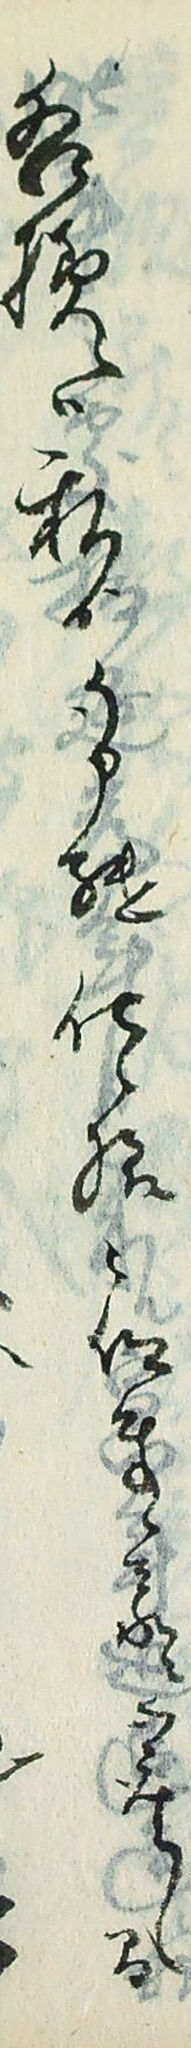各様へハ私ゟ御申継仕候様被仰付候義ニ御座候間
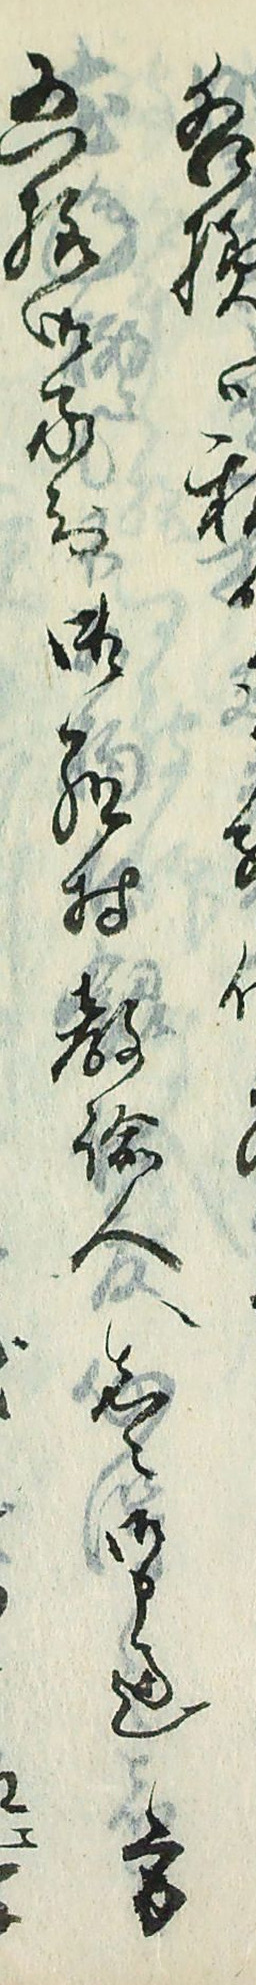右様御承知御組村教諭人へ先々御申通之方
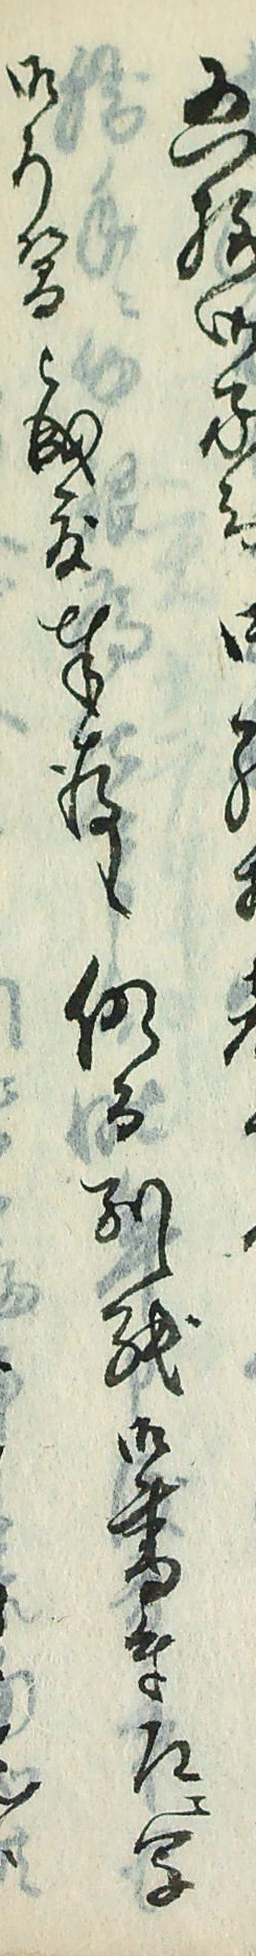御了簡被成度奉存候仍而別紙御書付左ニ写
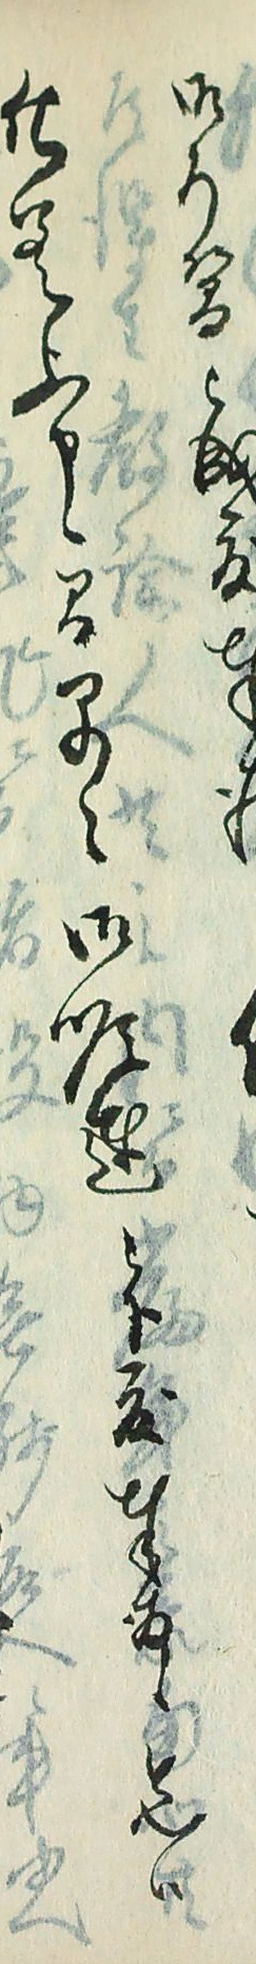仕差上申候間早々御順達被下度奉存候先ハ
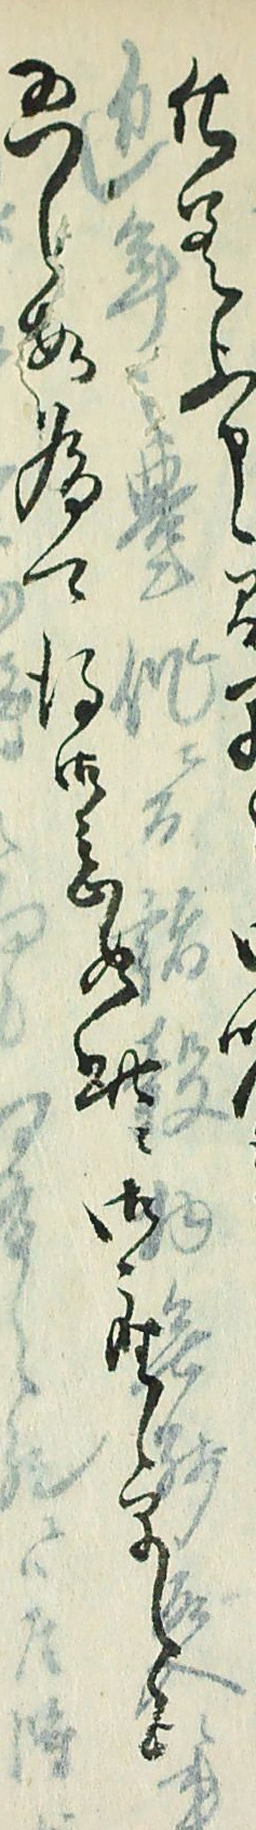右之段為可得御意如此ニ御座候早々以上
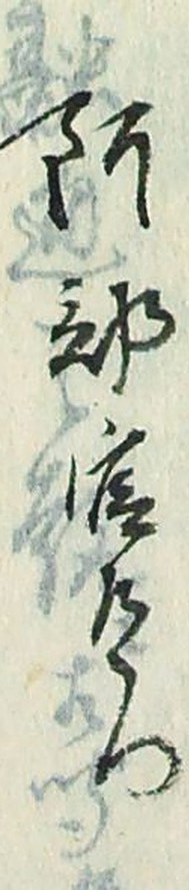阿部官左衛門
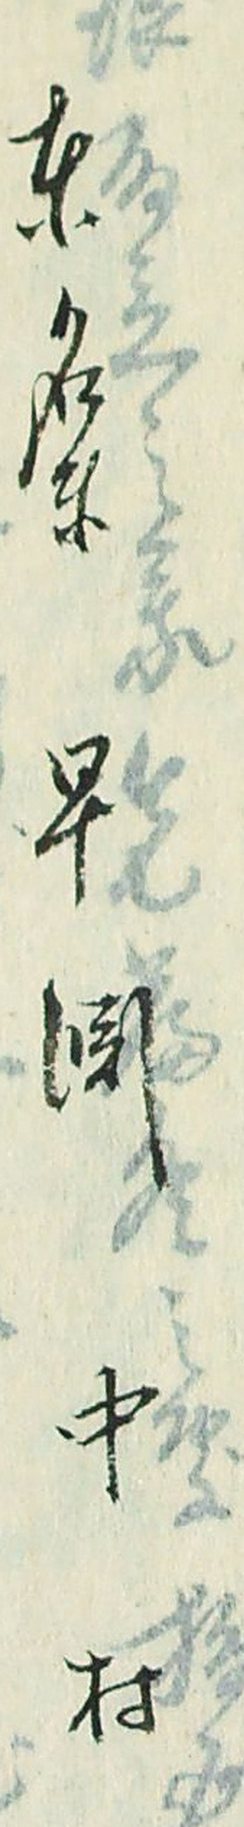東名東早渕中村
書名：諸御趣意書并御下知向之写
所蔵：鳴門教育大学 Naruto University of Education
